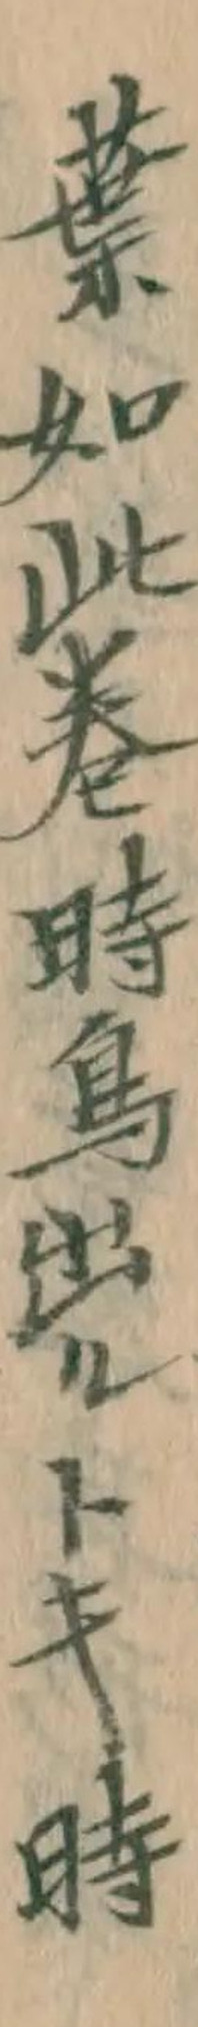葉如此巻時鳥出ルトキ時
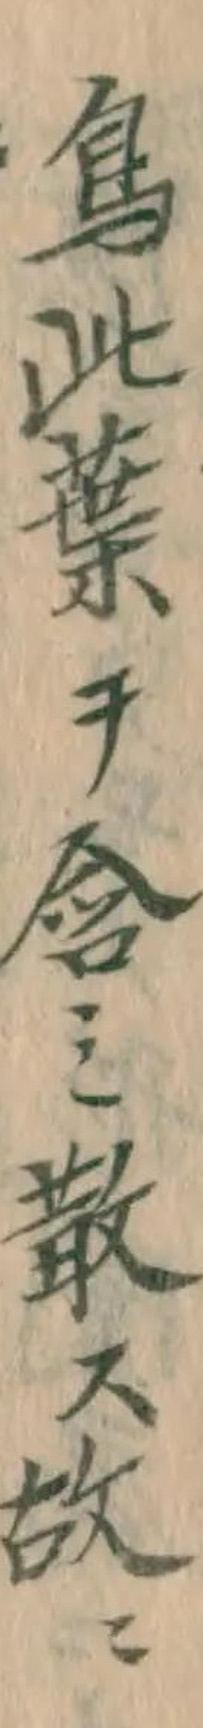鳥此葉ヲ含ミ散ス故ニ
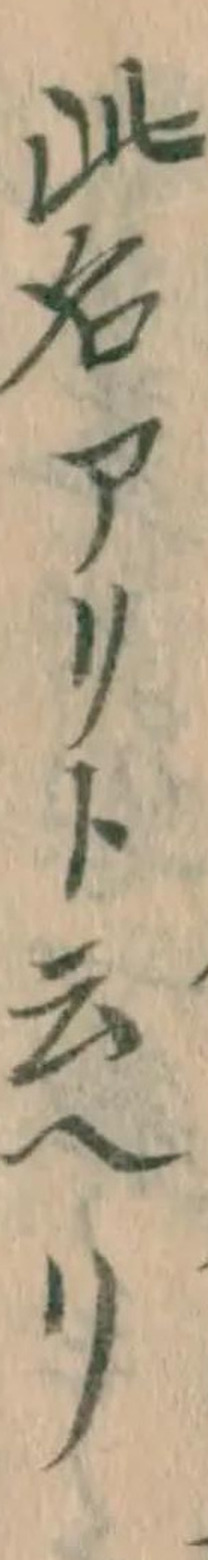此名アリト云ヘリ
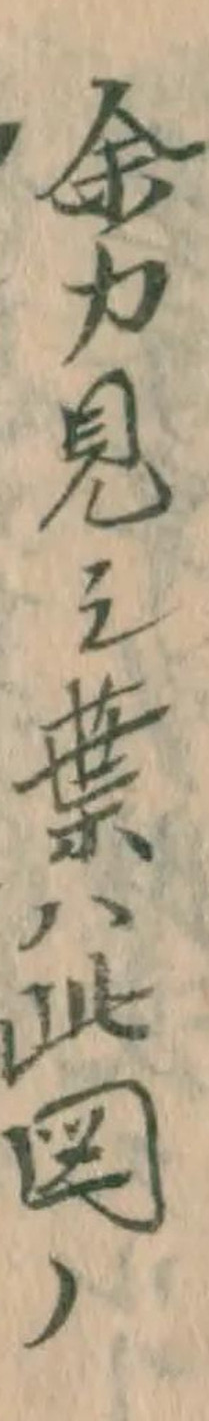余カ見シ葉ハ此図ノ
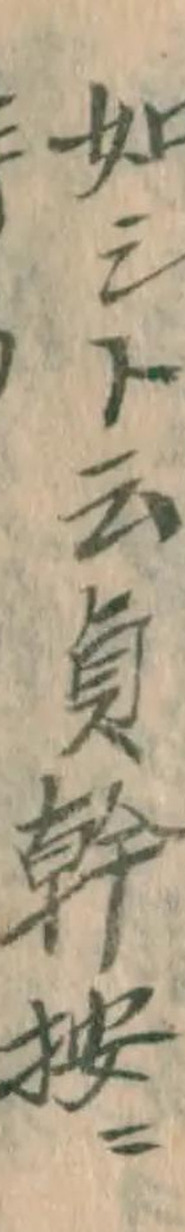如シト云貞幹按ニ
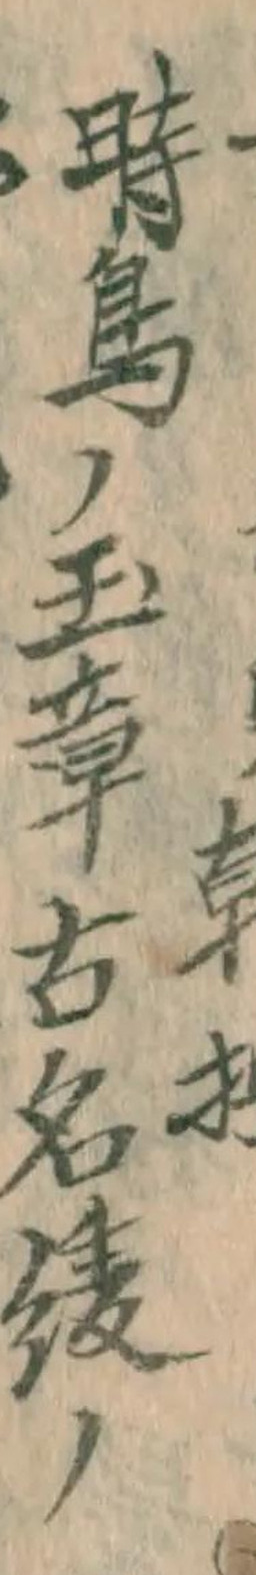時鳥ノ玉章古名綾ノ
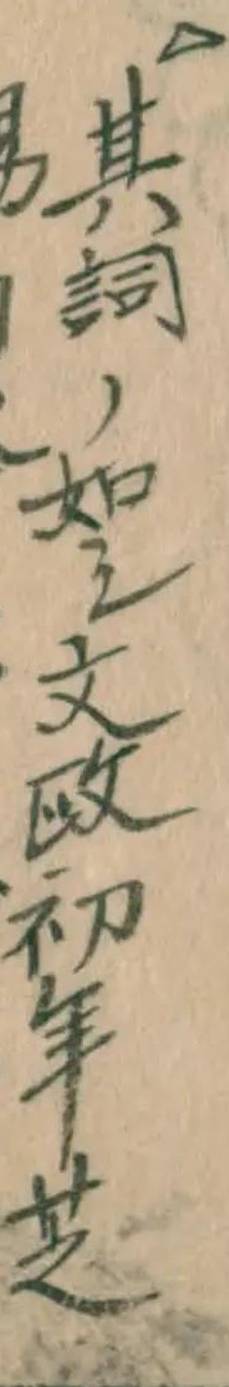△其詞ノ如シ文政初年芝
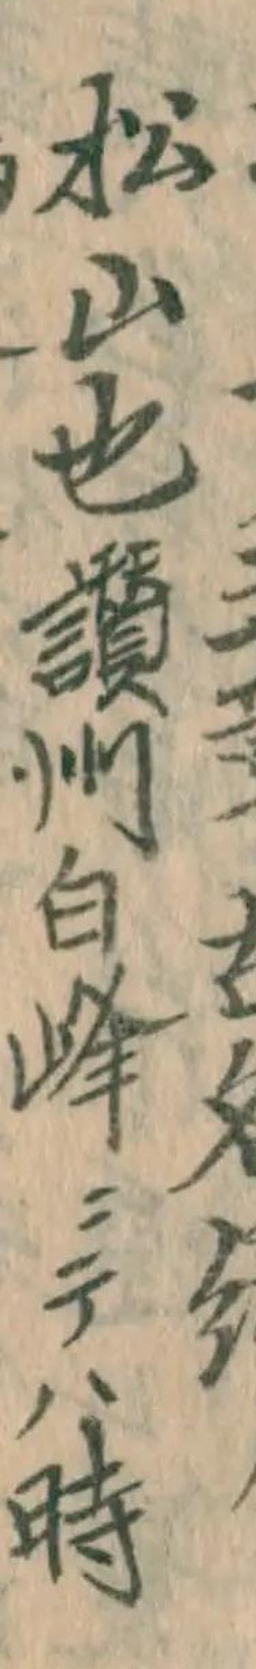松山也讃州白峰ニテハ時
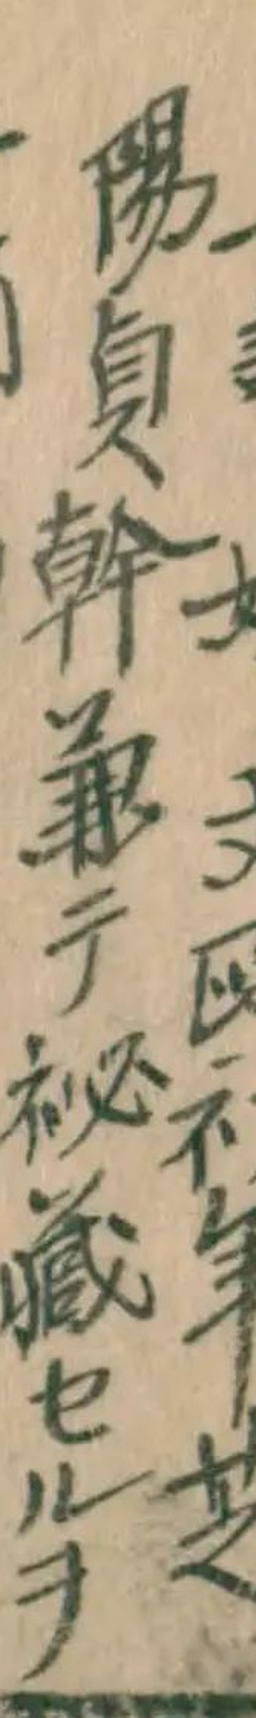陽貞幹兼テ秘蔵セルヲ
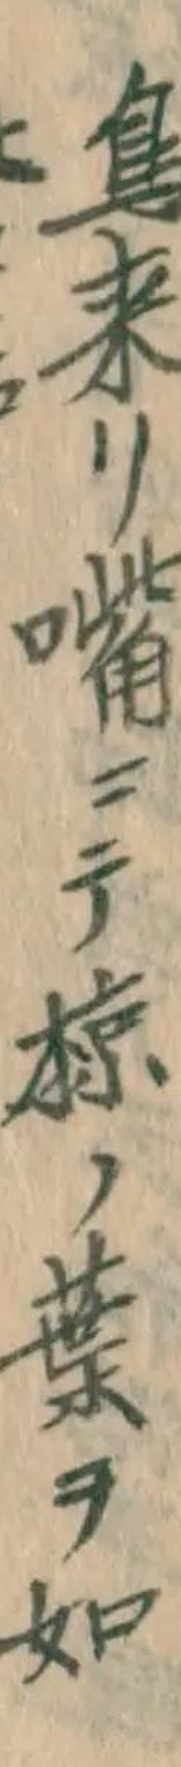鳥来リ嘴ニテ椋ノ葉ヲ如
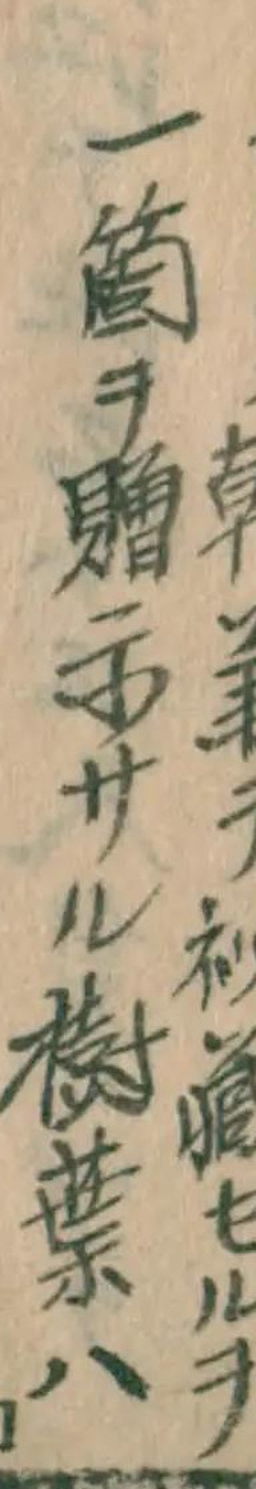一箇ヲ贈示サル樹葉ハ▢
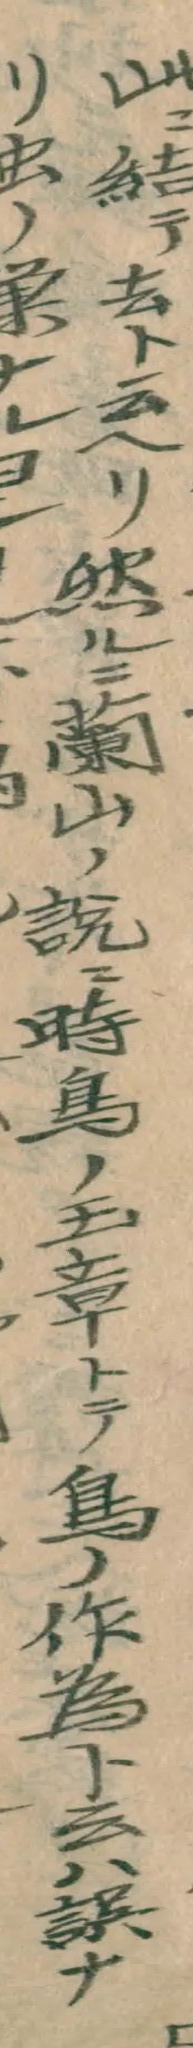此ニ結テ去ト云ヘリ然ルニ蘭山ノ説ニ時鳥ノ玉章トテ鳥ノ作為ト云ハ誤ナ
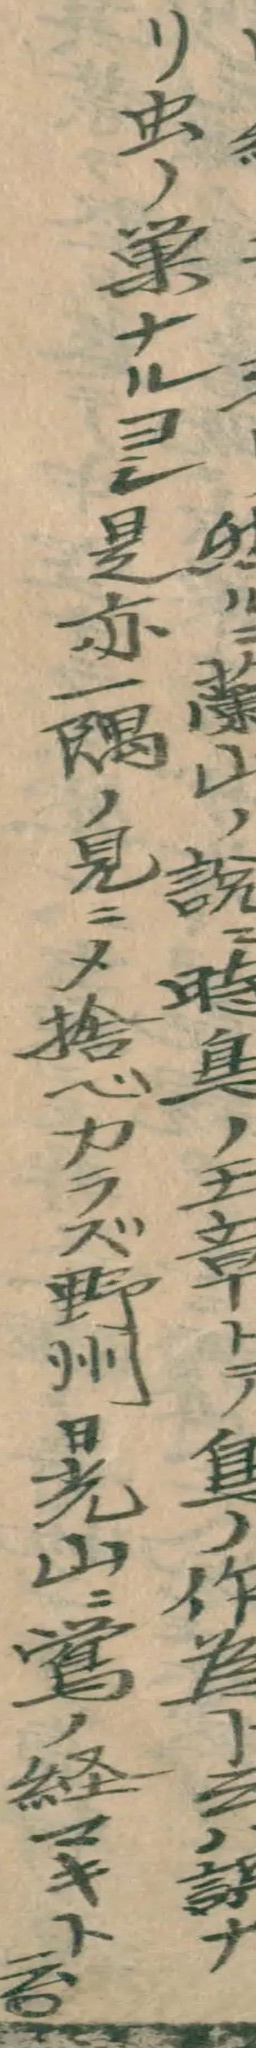リ虫ノ巣ナルヨシ是亦一隅ノ見ニシテ捨ベカラズ野州日光山ニ鴬ノ経マキト云○

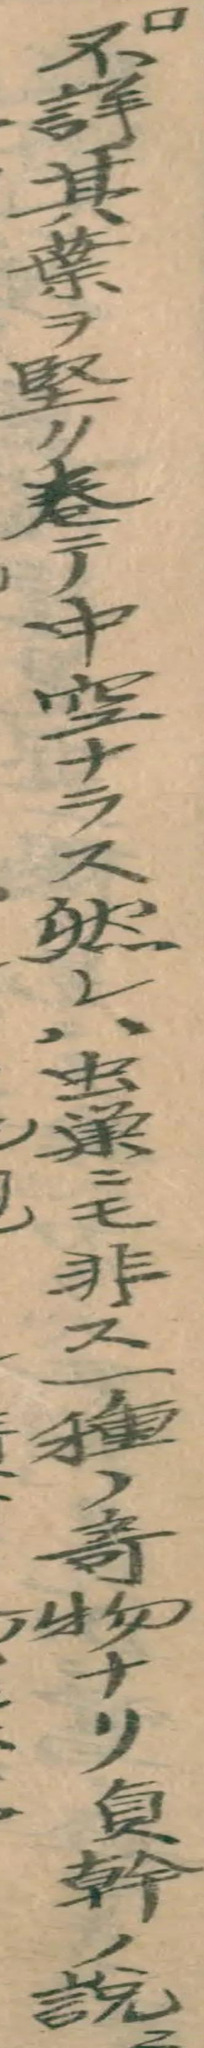▢不詳其葉ヲ堅ク巻テ中空ナラス然レハ虫巣ニモ非ス一種ノ奇物ナリ貞幹ノ説ニ
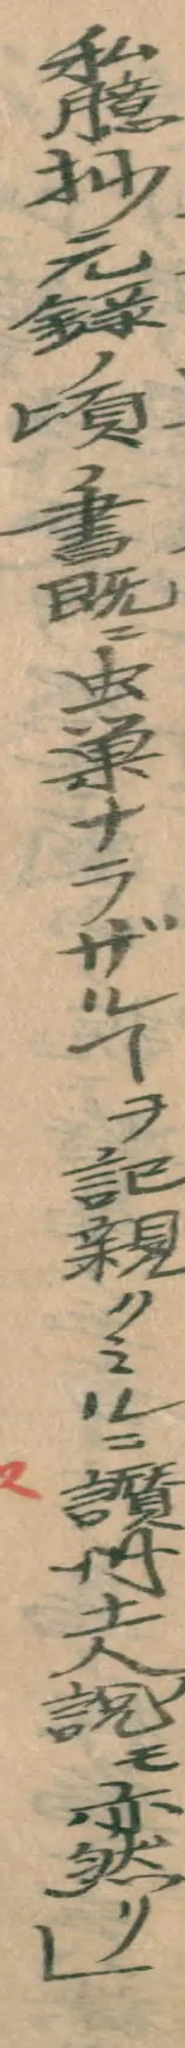私臆抄元錄ノ頃ノ書既ニ虫巣ナラザルコトヲ記親クミルニ讃州土人ノ説モ亦然リ」
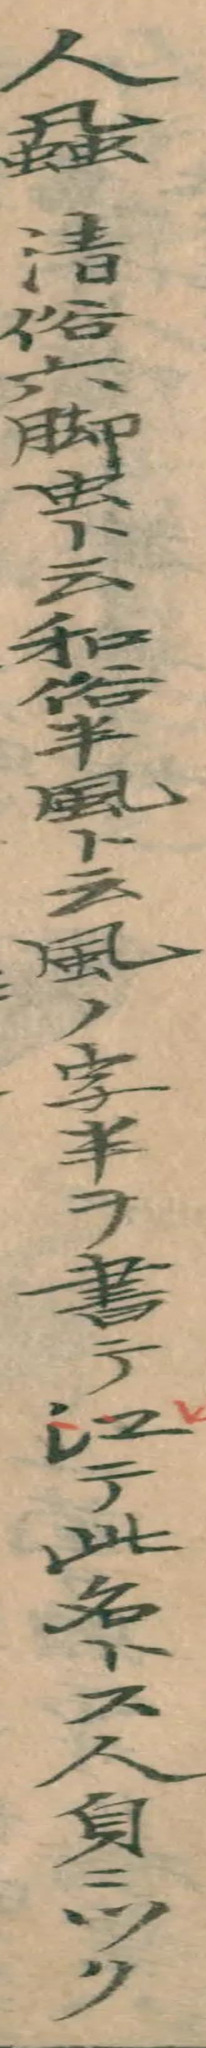人蝨清俗六脚虫ト云和俗半風ト云風ノ字半ヲ書テ江以テ此名トス人身ニツク
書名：千蟲譜 3巻. [1]
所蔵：国立国会図書館 National Diet Library, JAPAN
